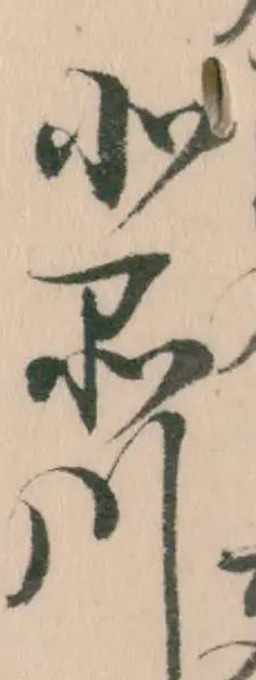北品川
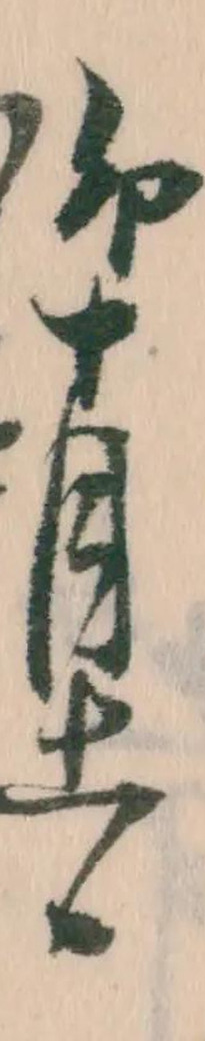卯十月十一日
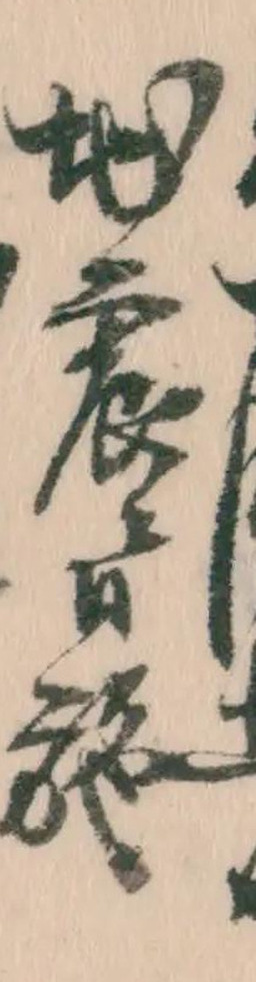地震ニ付施
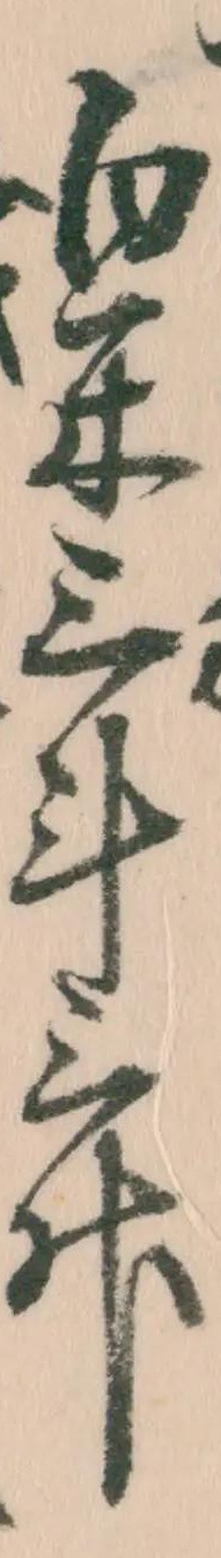一白米三斗三升
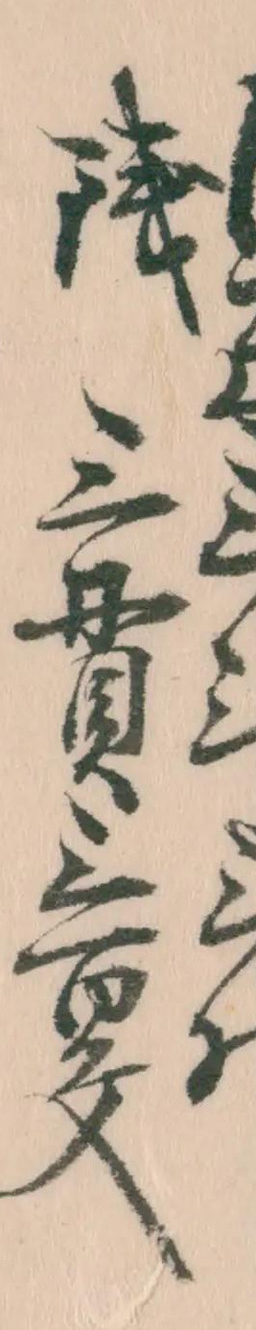銭三貫三百文
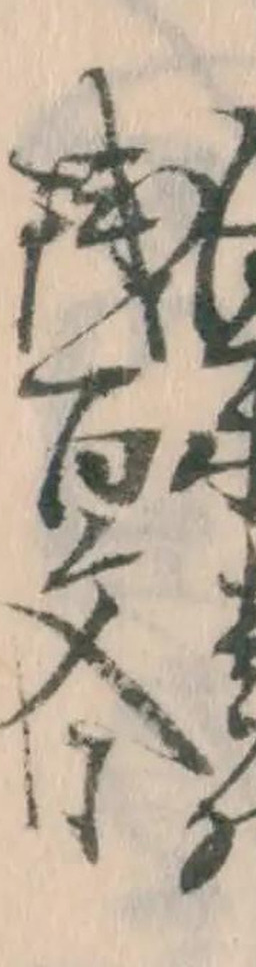銭百文ツヽ

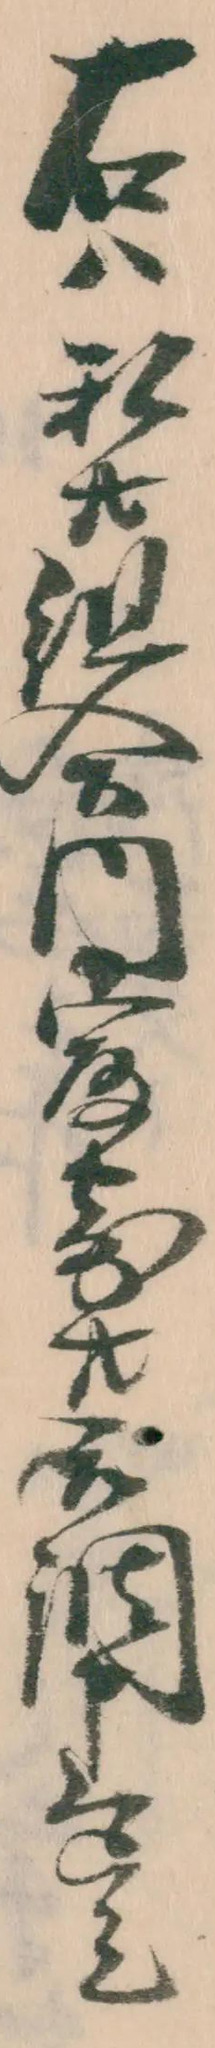右ハ私共組合内最寄共取調申上候以上
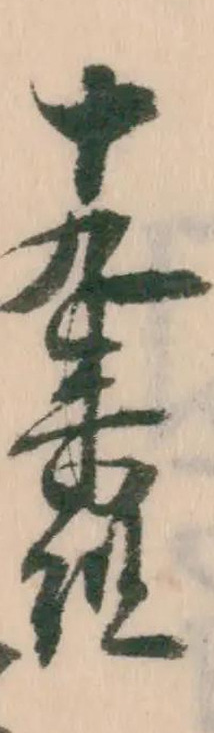十九番組
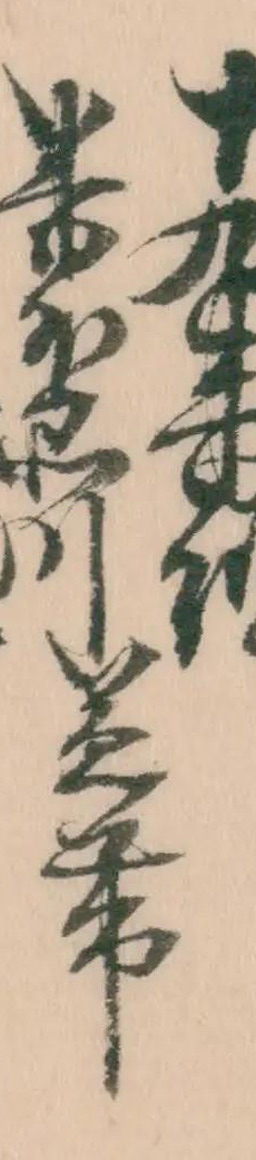番外品川兼帯
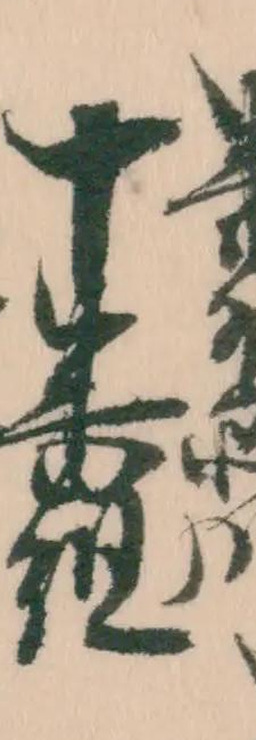十番組
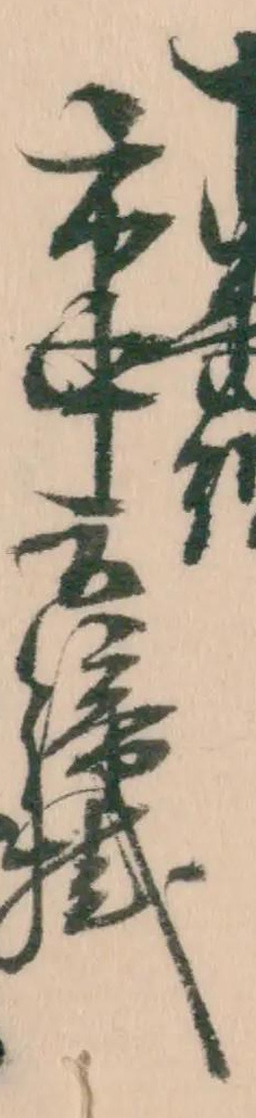市中取締掛
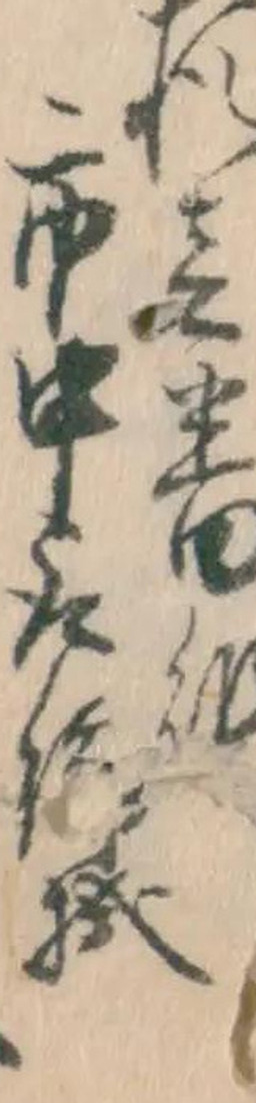市中取締掛
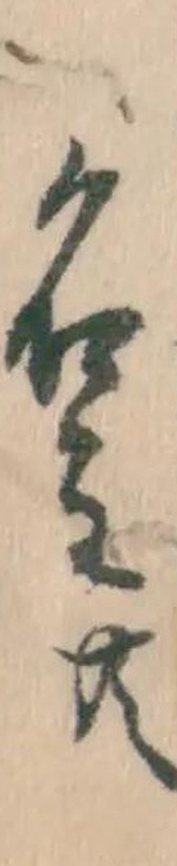名主共

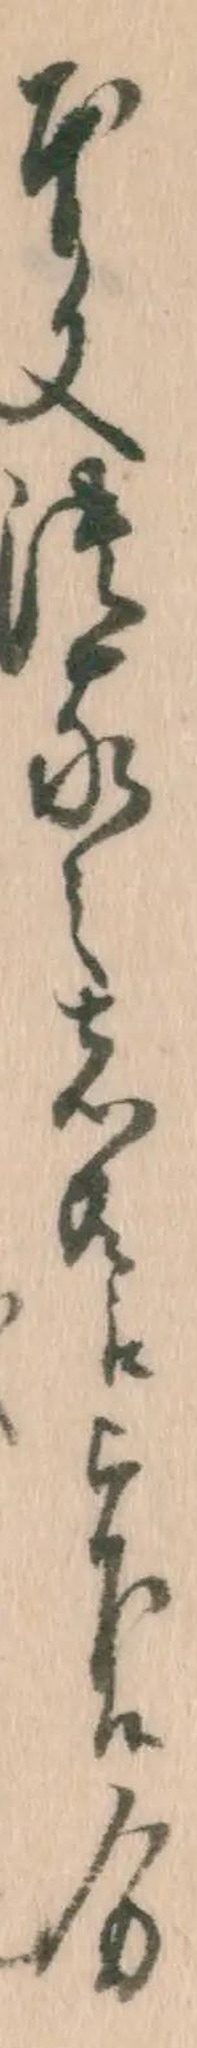本文潰家之者共え被下候分
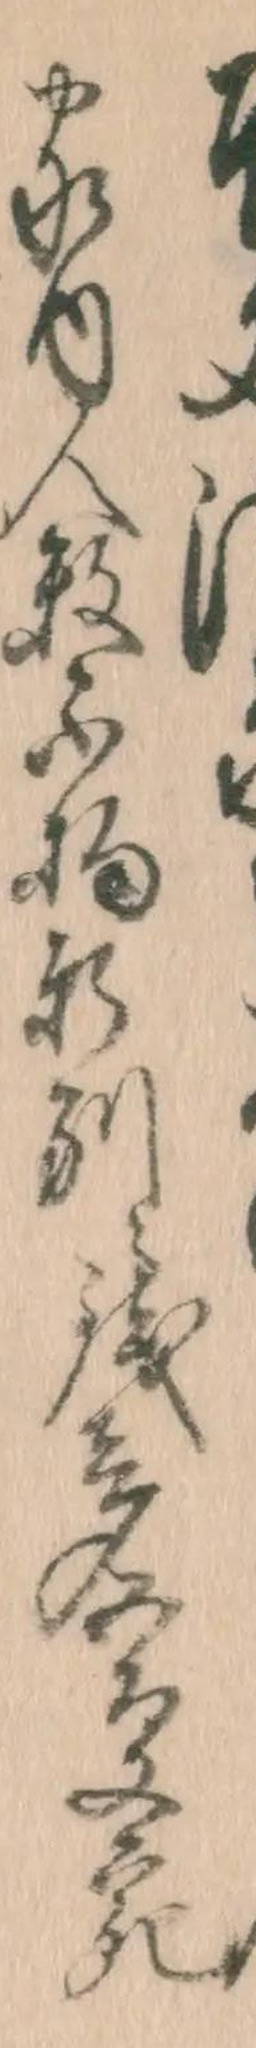家内人数不拘軒別ニ銭壱貫五百文宛
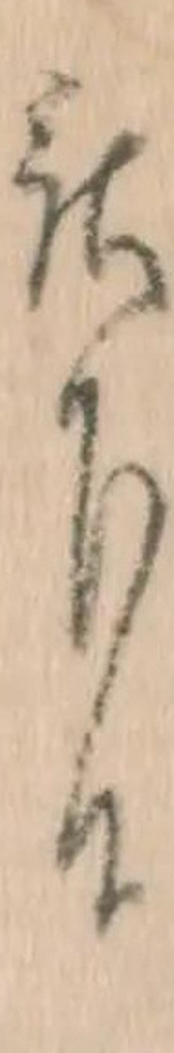被下候
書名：武家方并寺院等ニテ施差出候一件
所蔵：国立国会図書館 National Diet Library, JAPAN
